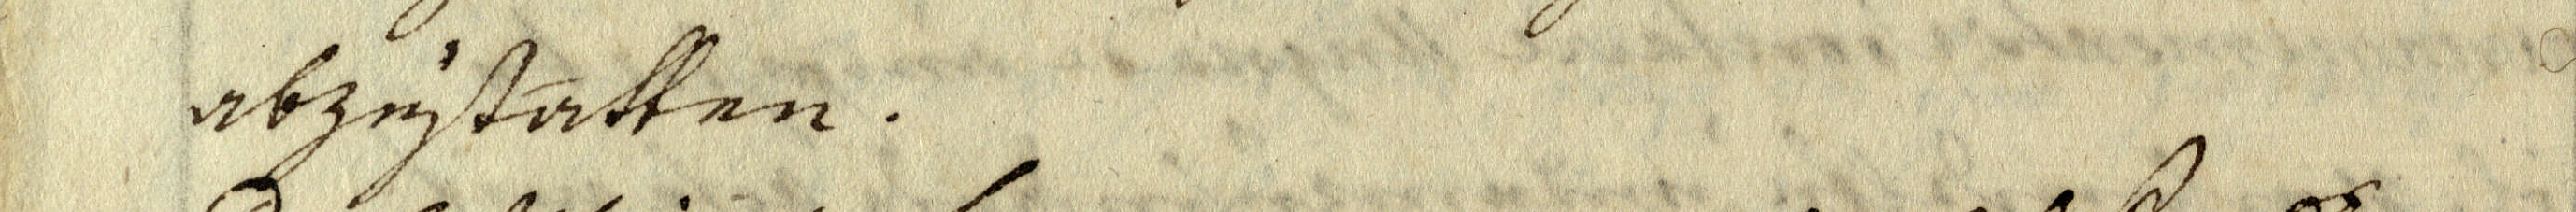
abzustatten.
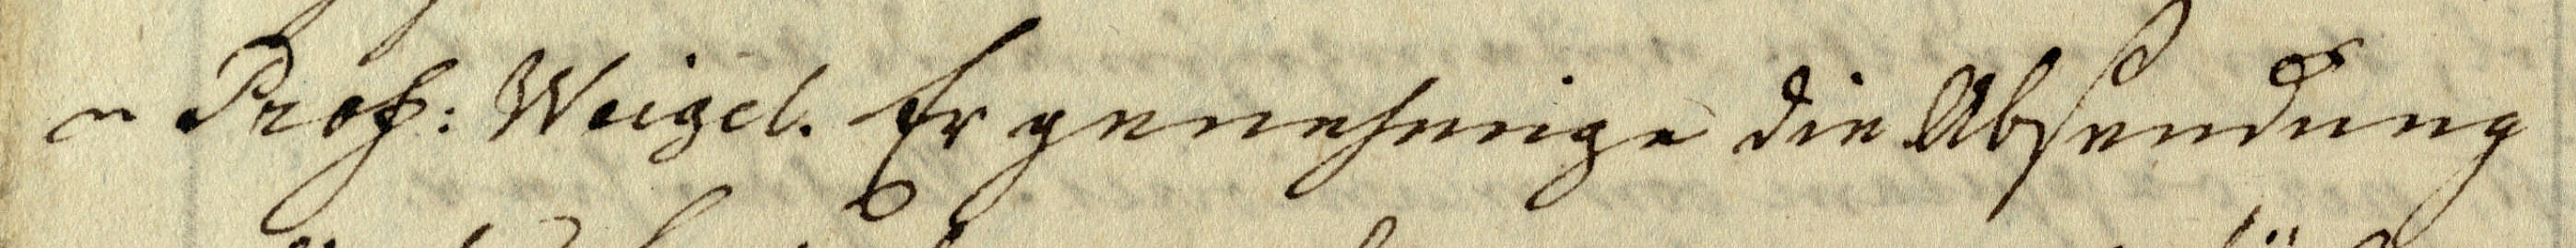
Prof. Weigel. Er genehmige die Absendung
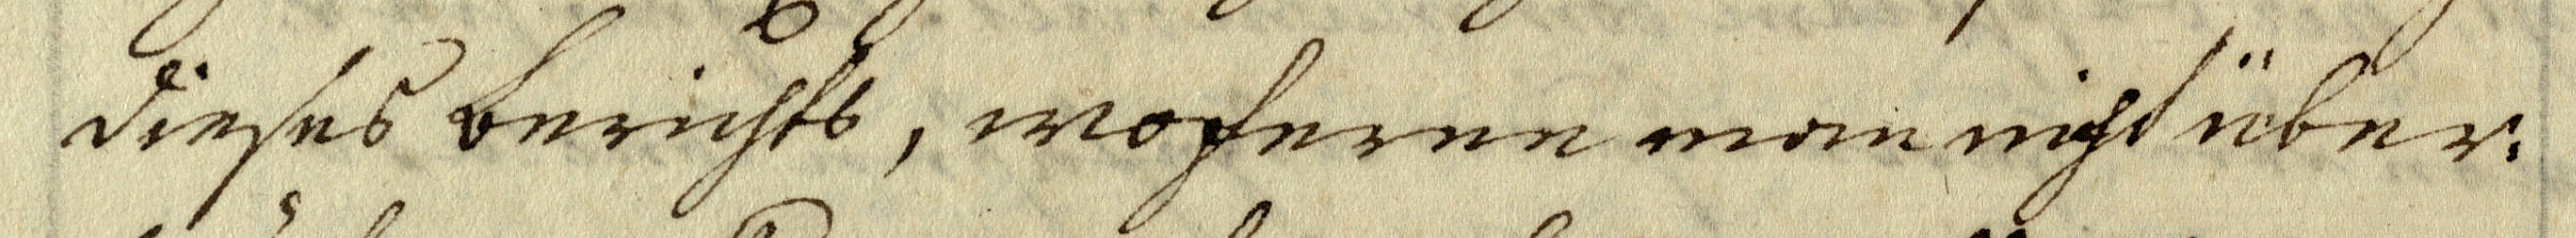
dieses Berichts, woferne man nicht über¬
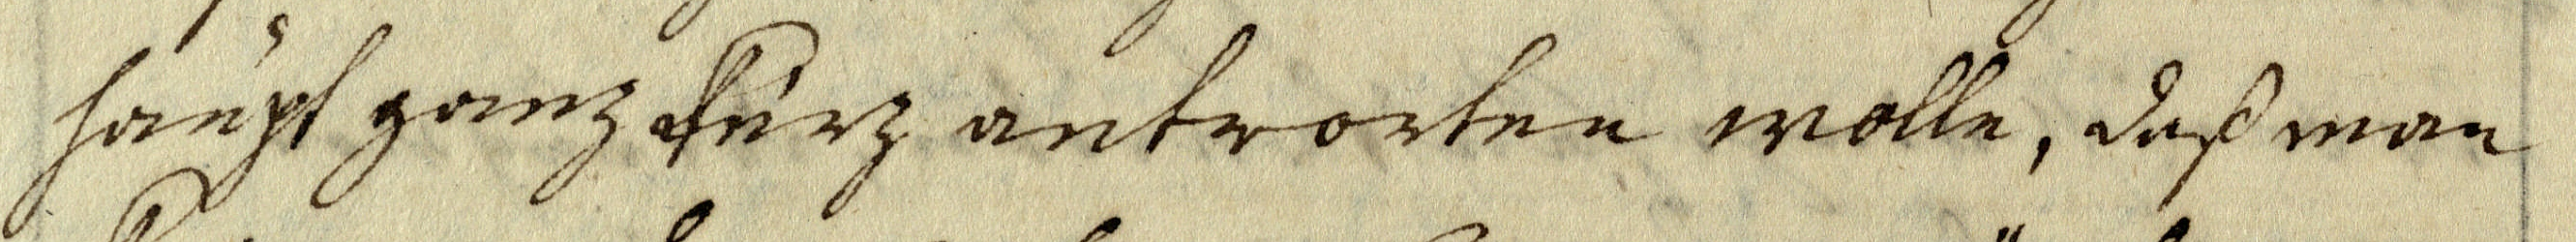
haupt ganz kurz antworten wolle, daß man
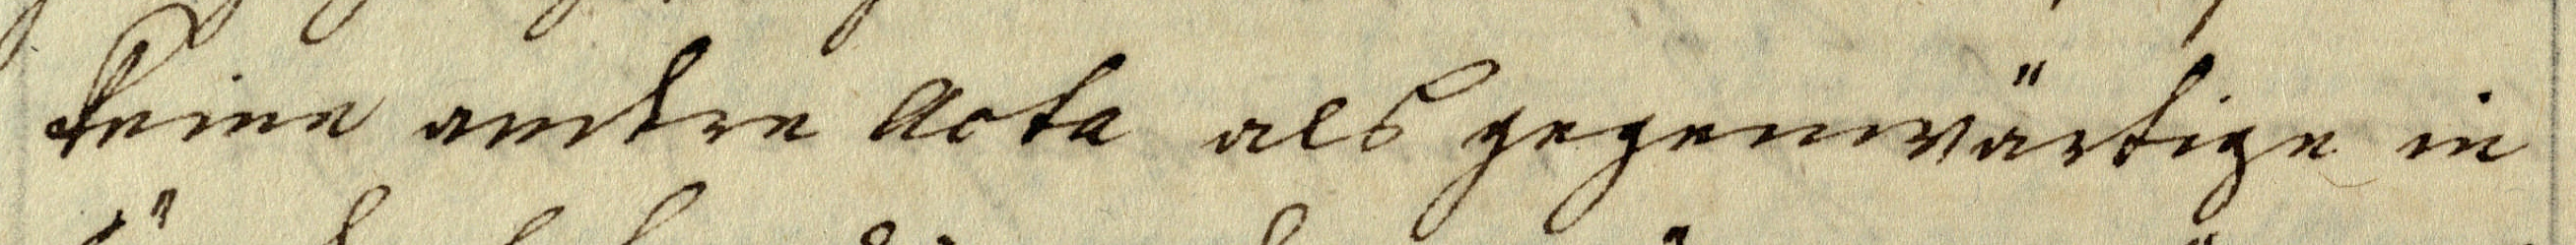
keine andere Acta als gegenwärtige in
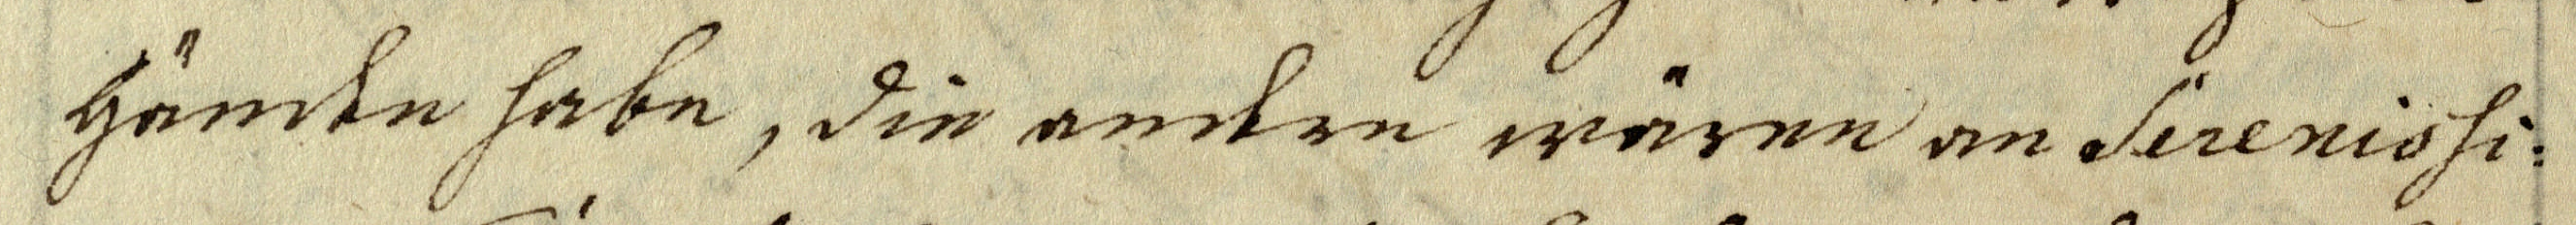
Händen habe, die andern wären an Serenissi¬
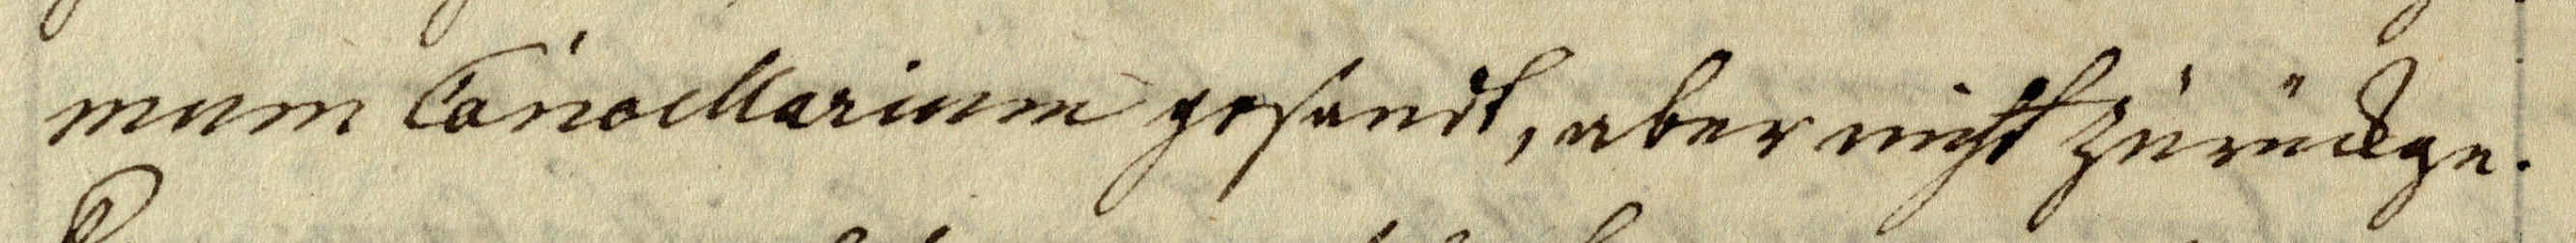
mum Cancellarium gesandt, aber nicht zurückge¬
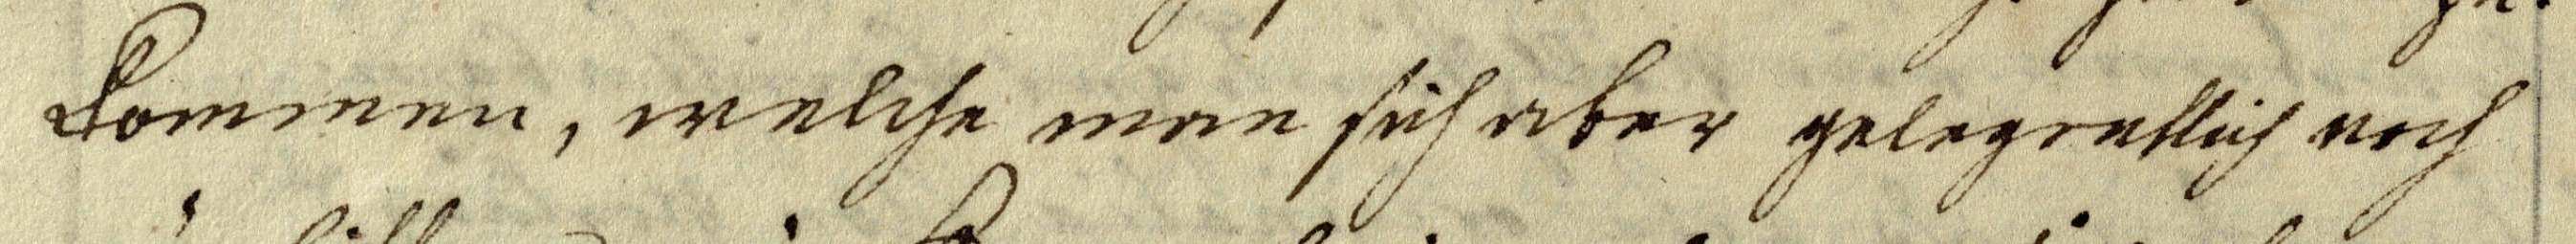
kommen, welche man sich aber gelegentlich noch
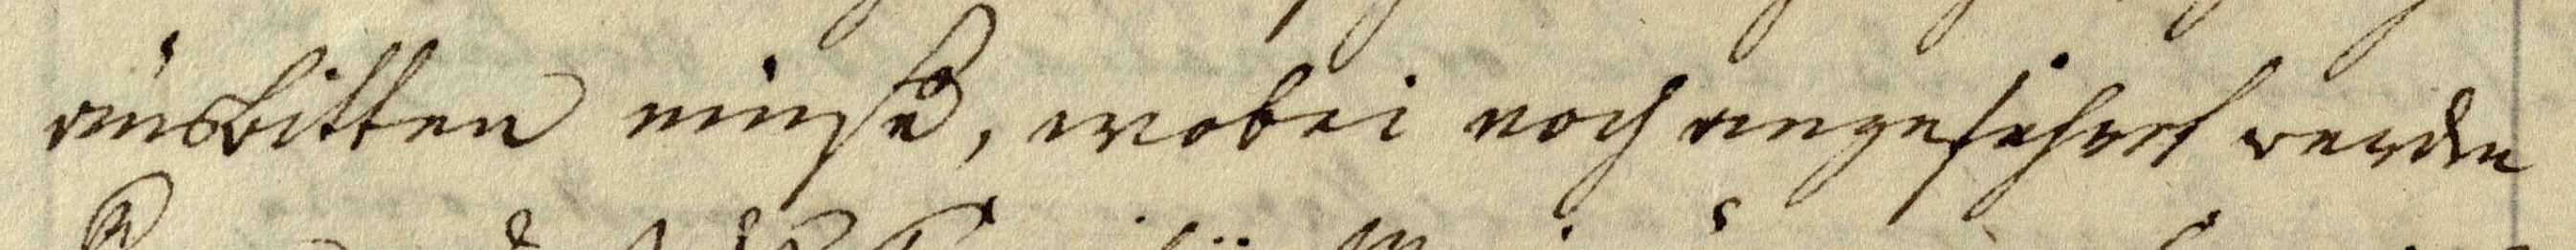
ausbitten müße, wobei noch angeführt werden
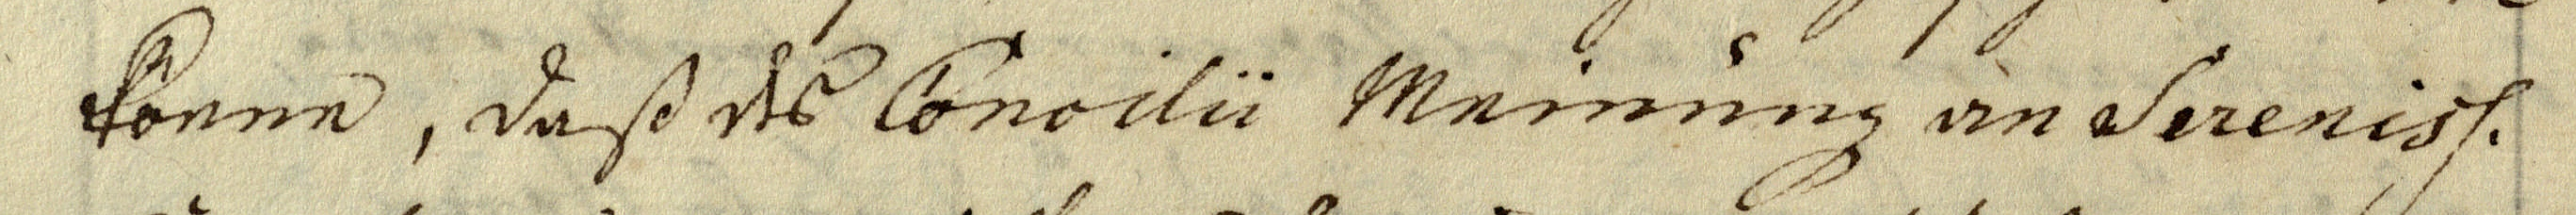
könne, daß des Concilii Meinung an Sereniss.
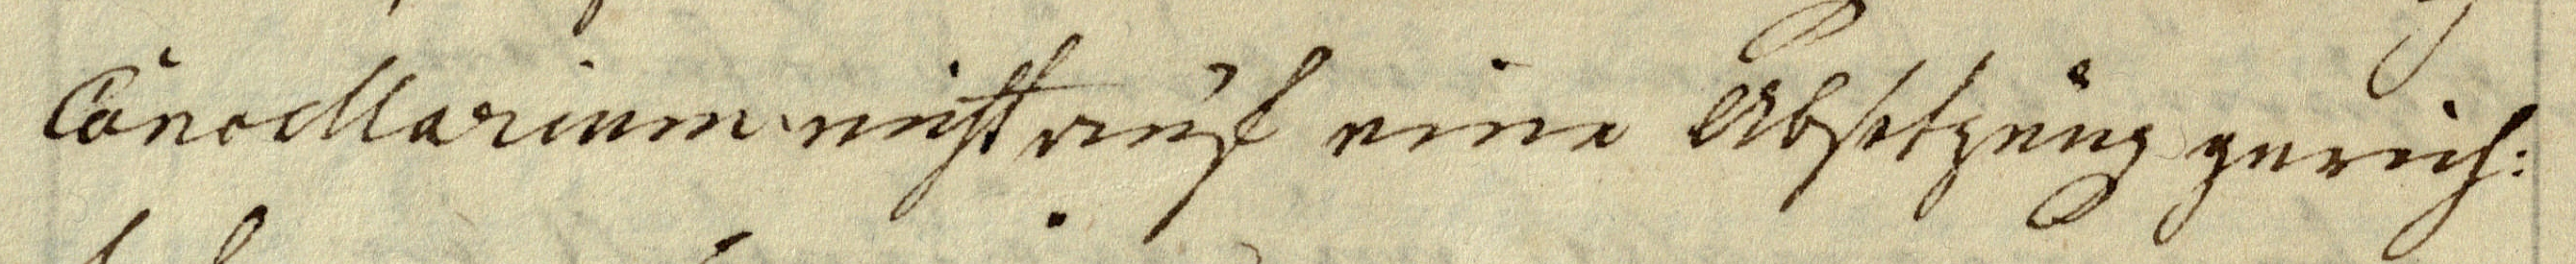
Cancellarium nicht auf eine Absetzung gerich¬
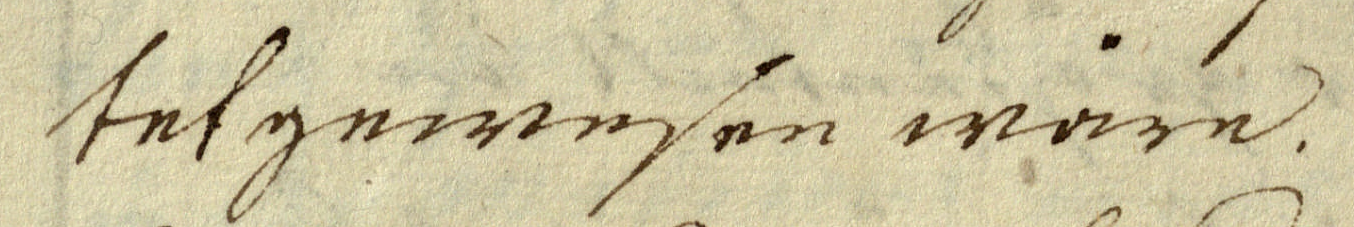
tet gewesen wäre.
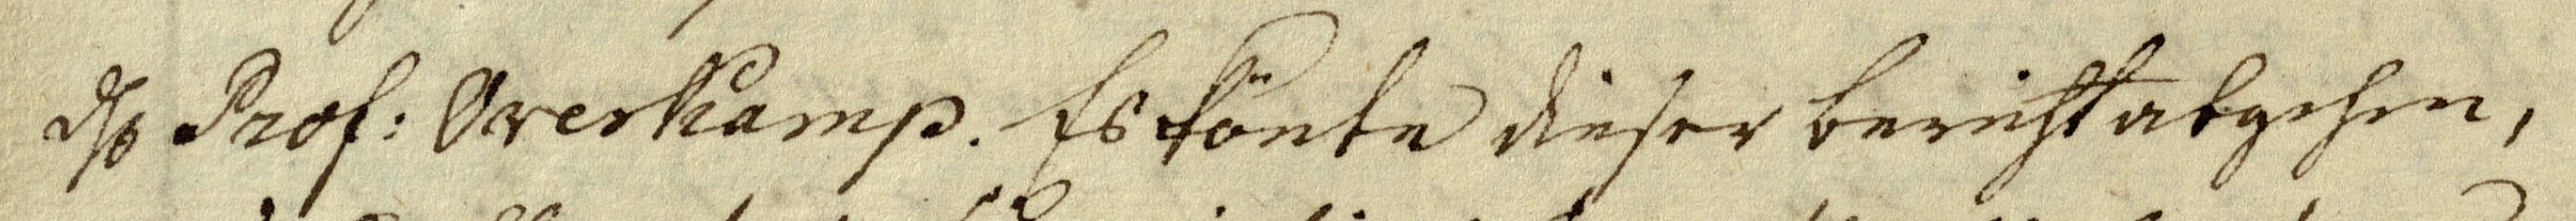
dh Prof. Overkamp. Es könte dieser Bericht abgehen,
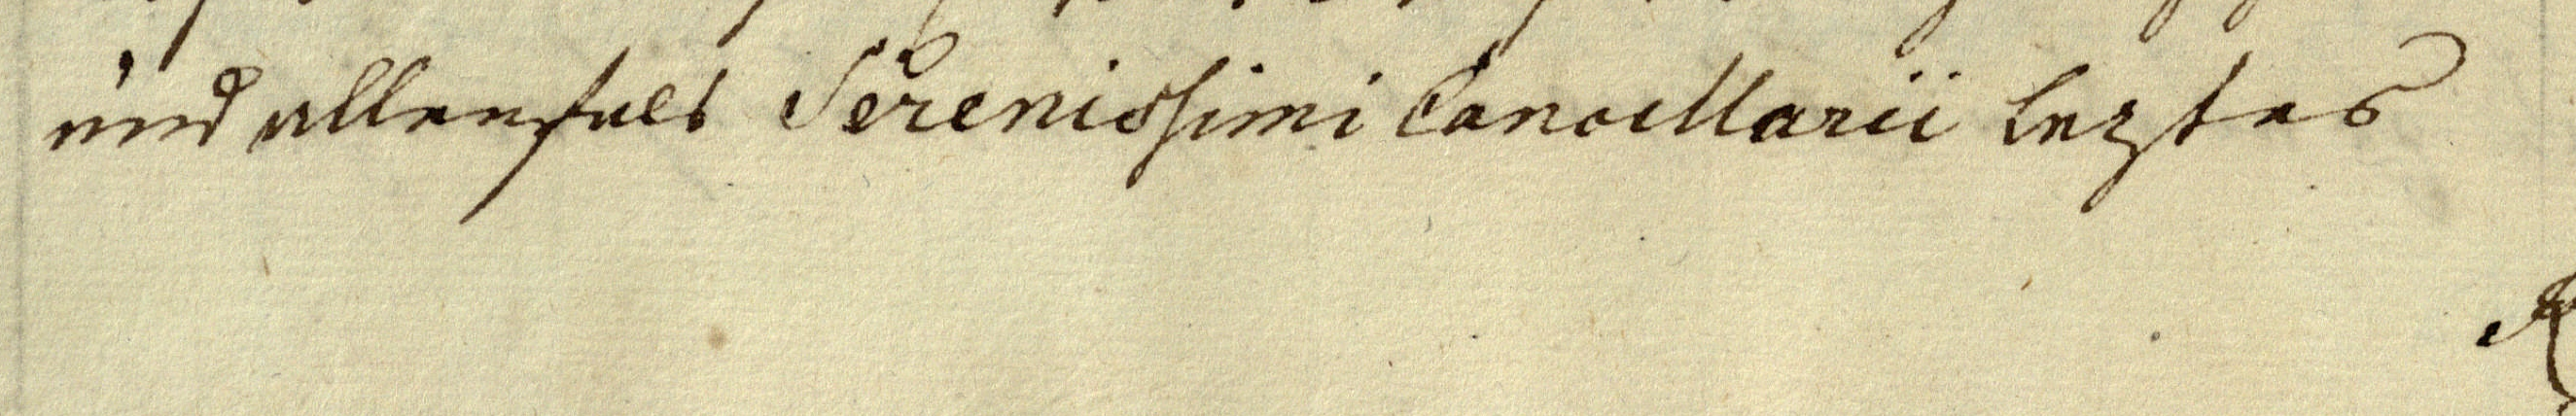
und allenfals Serenissimi Cancellarii leztes
